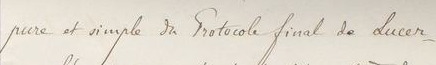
pure et simple du Protocole final de Lucer-
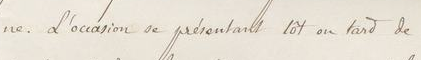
ne. L'occasion se présentant tôt ou tard de
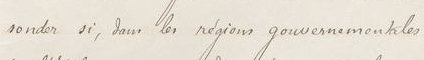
sonder si, dans les régions gouvernementales
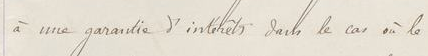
à une garantie d'intérêts dans le cas où le
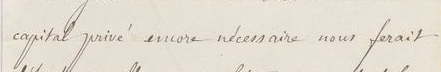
capital privé encore nécessaire nous ferait
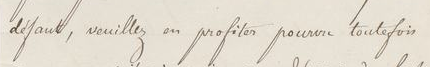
défaut, veuillez en profiter pourvu toutefois
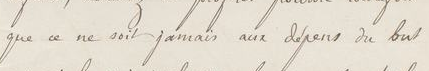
que ce ne soit jamais aux dépens du but
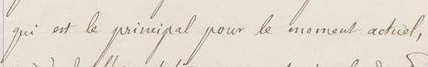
qui est le principal pour le moment actuel,
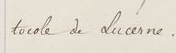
tocole de Lucerne.
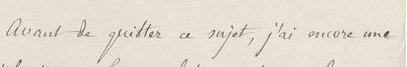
Avant de quitter ce sujet, j'ai encore une
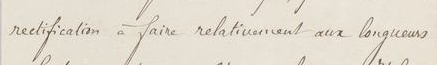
rectification à faire relativement aux longueurs
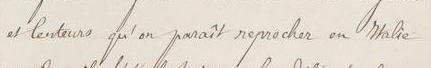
et lenteurs qu'on paraît reprocher en Italie
